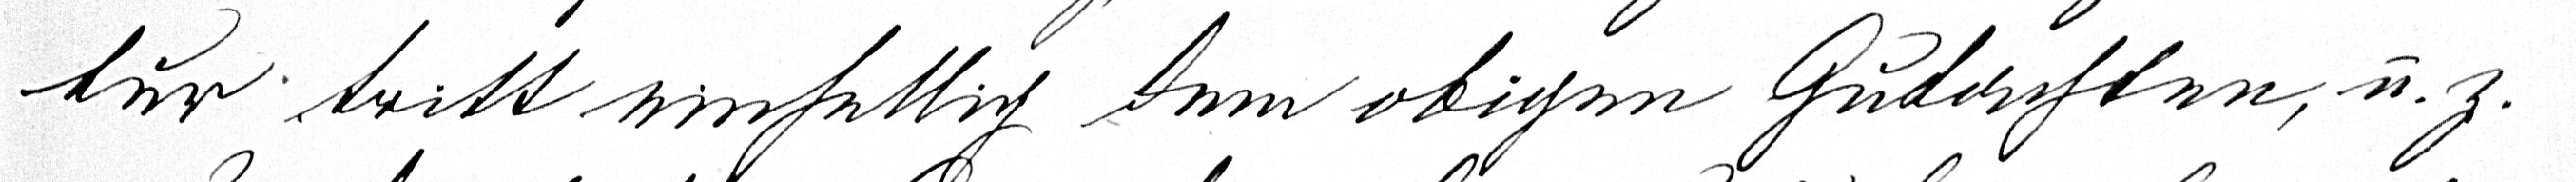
tur tritt einhellig dem obigen Gutachten, u.z.
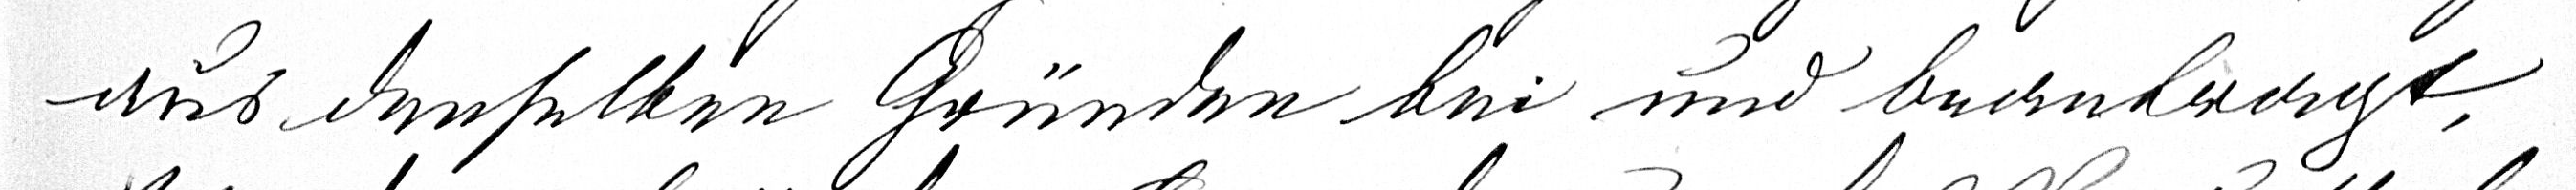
aus denselben Gründen bei und beantragt,
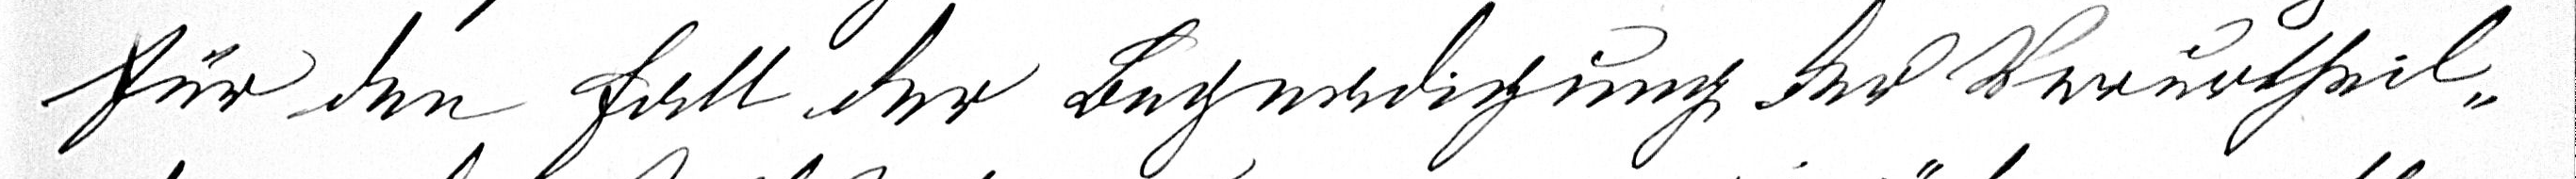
für den Fall der Begnadigung der Verurtheil¬
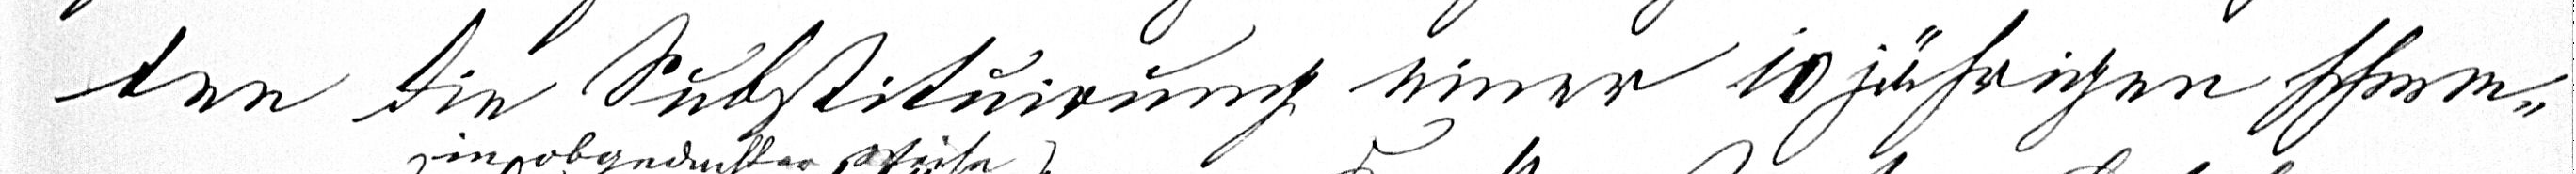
ten die Substituirung einer 10 jährigen schwe¬
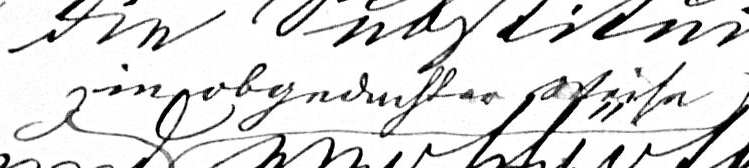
in ob gedachter Wiese
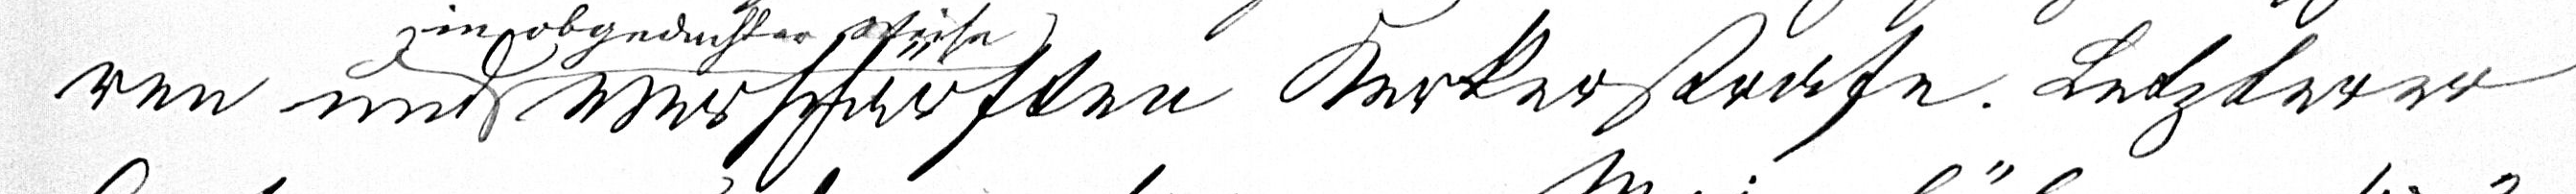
ren und verschärften Kerkerstrafe. Letzterer
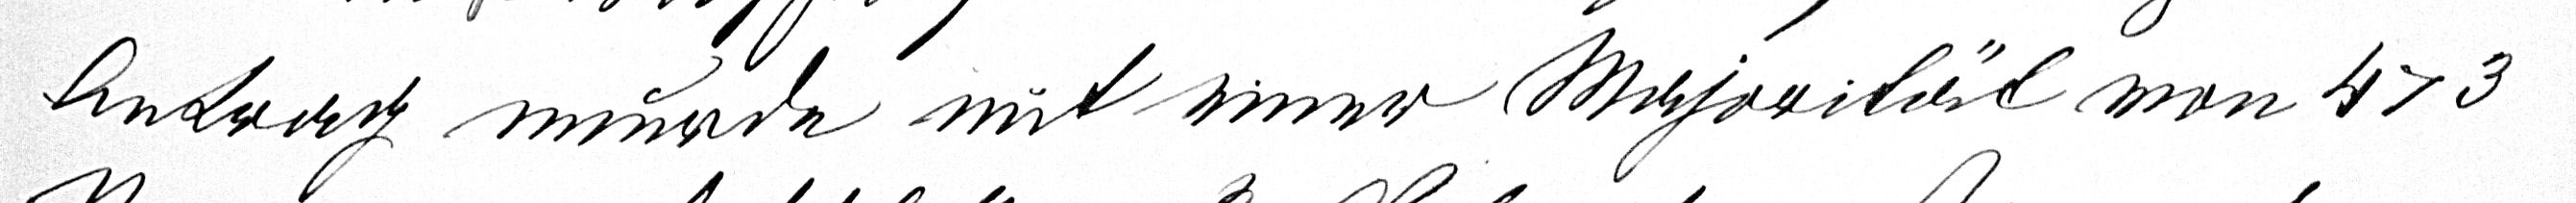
Antrag wurde mit einer Majorität von 473
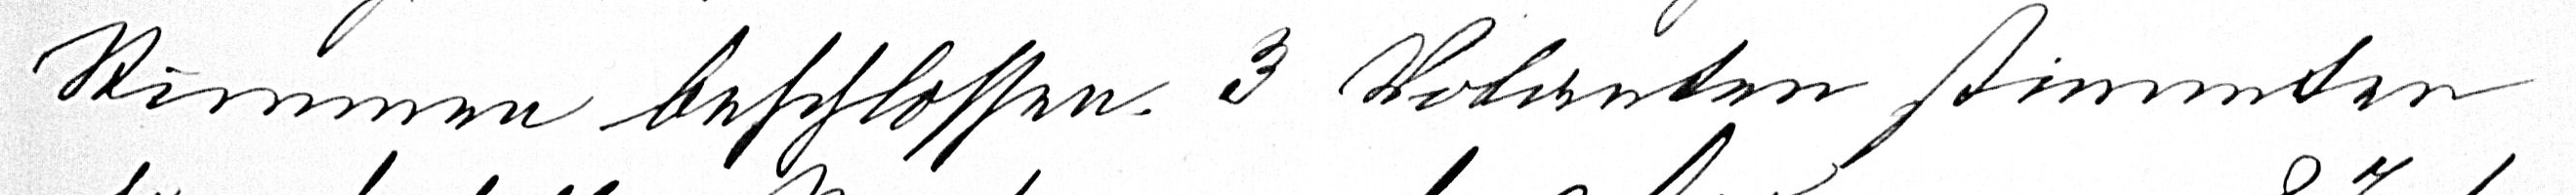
Stimmen beschlossen. 3 Votanten stimmten
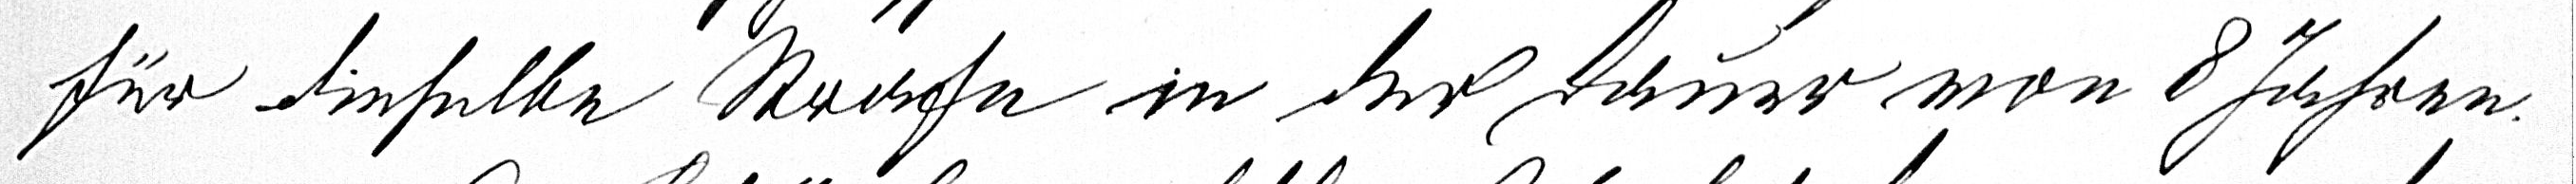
für dieselbe Strafe in der Dauer von 8 Jahren.
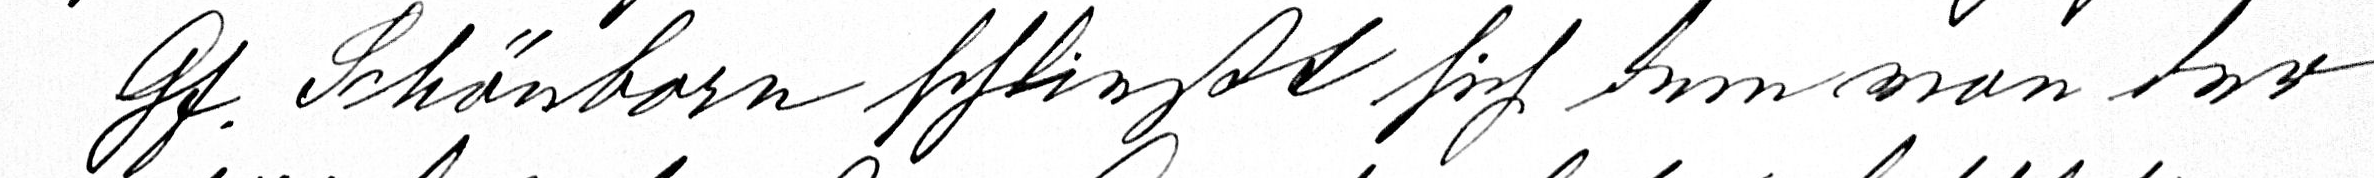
Gf. Schönborn schließt sich dem von der
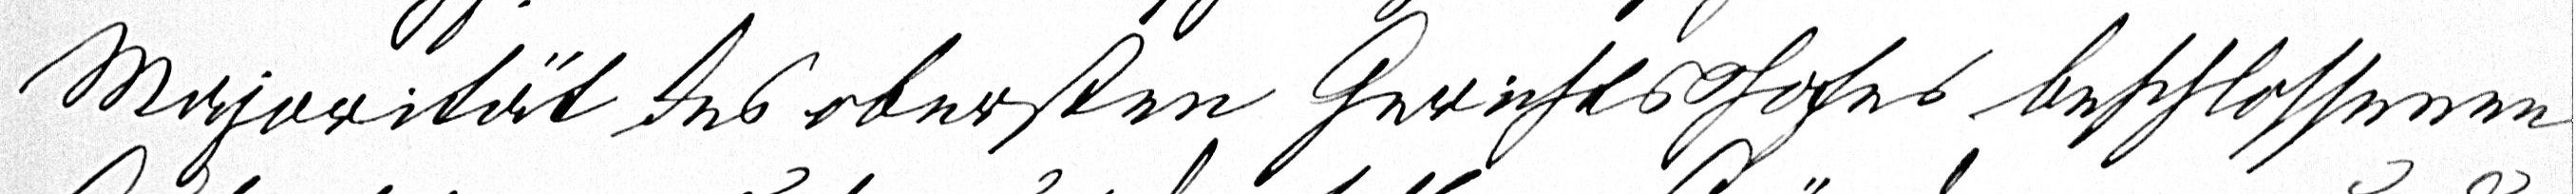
Majorität des obersten Gerichtshofes beschlossenen
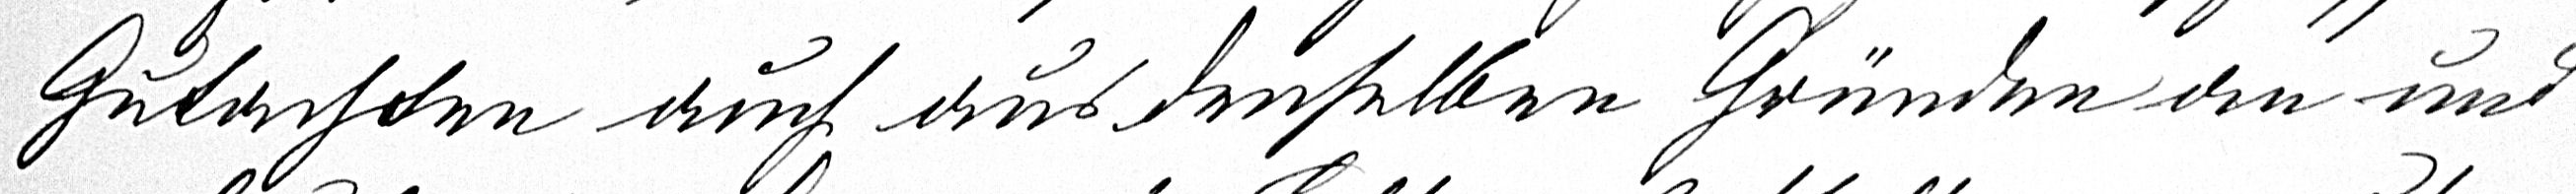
Gutachten auch aus denselben Gründen den und
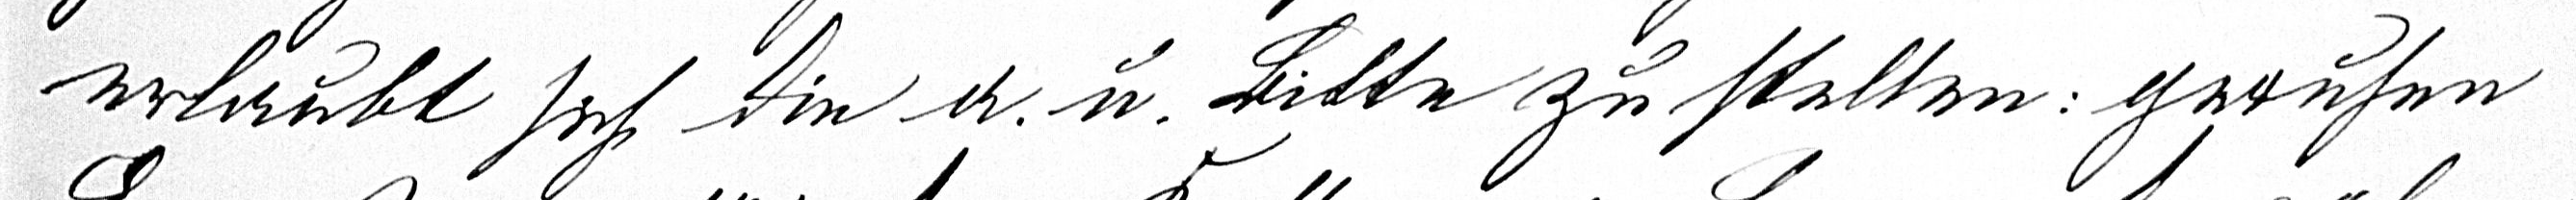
erlaubt sich die a. u. Bitte zu stellen: geruhen
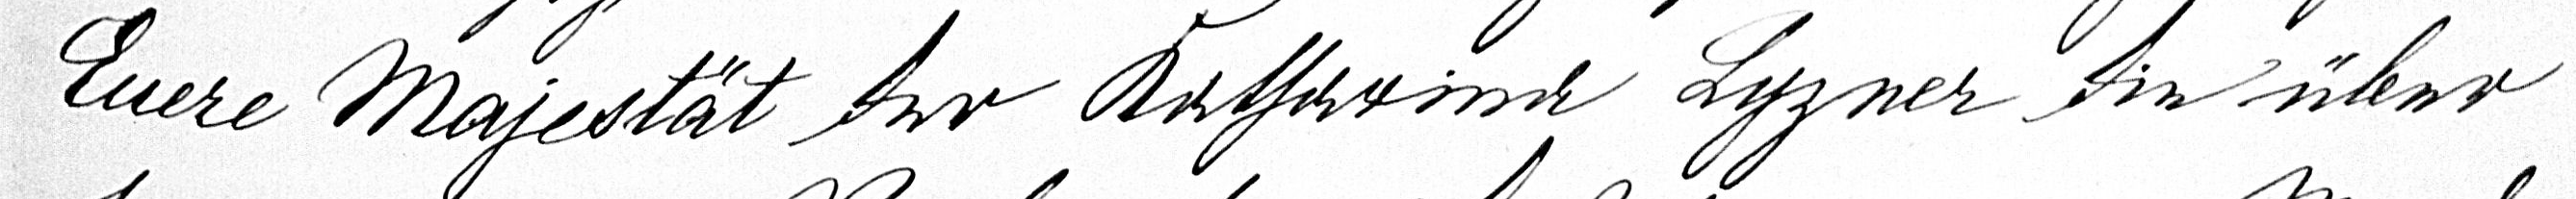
Euere Majestät der Katharina Lyzner die über
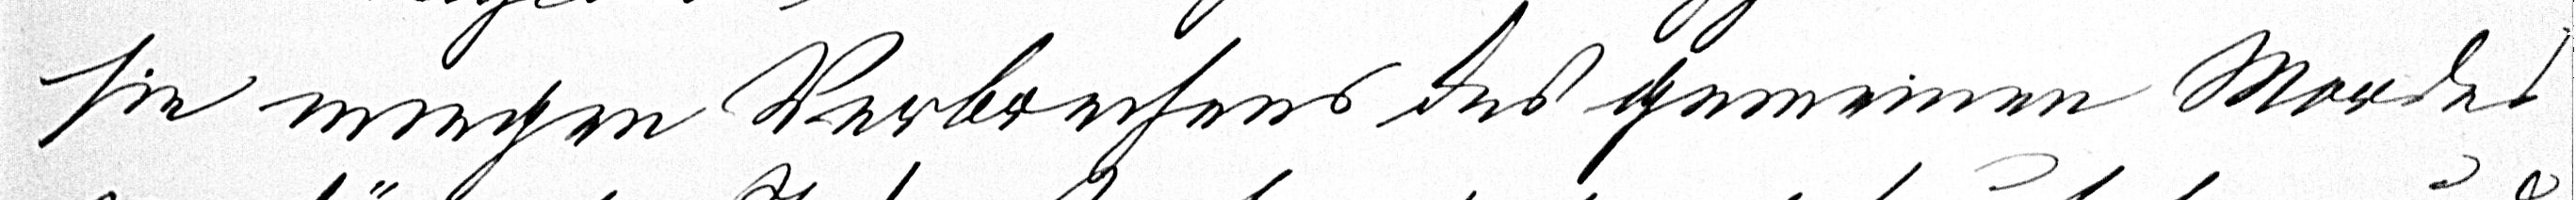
sie wegen Verbrechens des gemeinen Mordes
